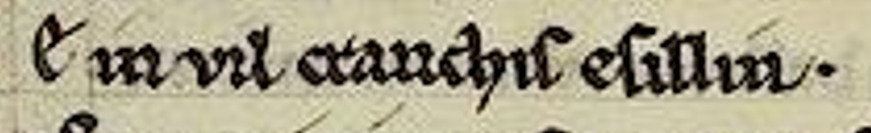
Ein vil cranchis eſillin.
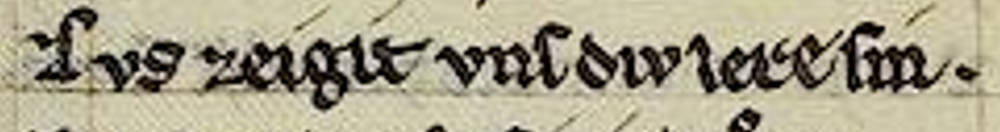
ſvs zeigit vnſ div lere ſin.
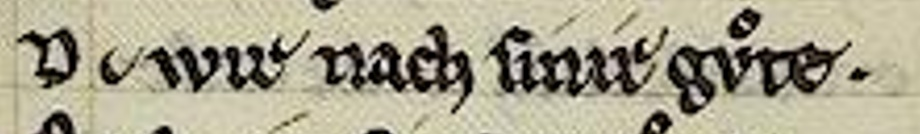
D(az) wir nach ſinir gv°ote.
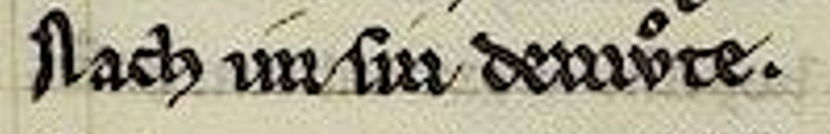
Nach im ſin demv°ote.
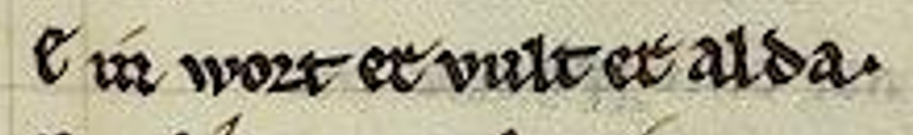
Ein wort er vult er alda.
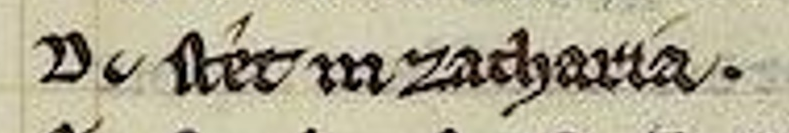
D(az) ſtet in zacharia.
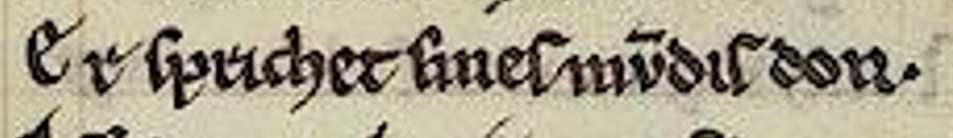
Er ſprichet ſineſ mv(n)diſ don.
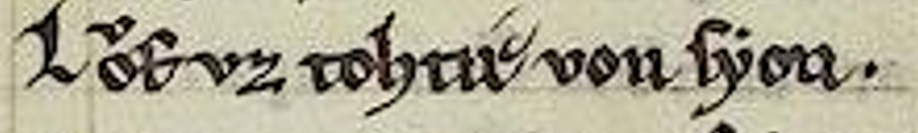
Lo°vf vz tohtir von ſyon.
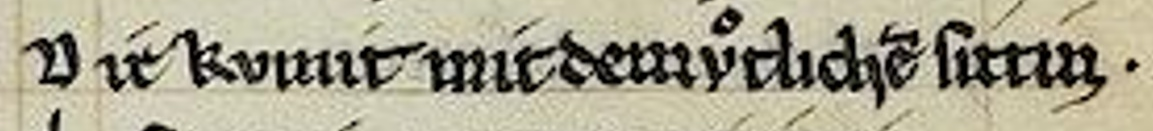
Dir kvmit mit demv°otliche(n) ſittin.
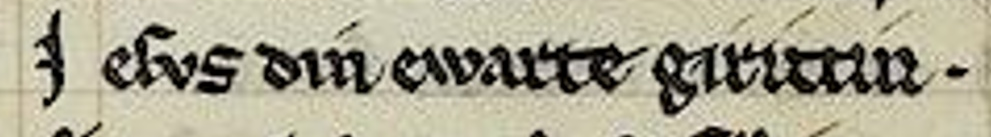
Jeſvs din ewarte girittin.
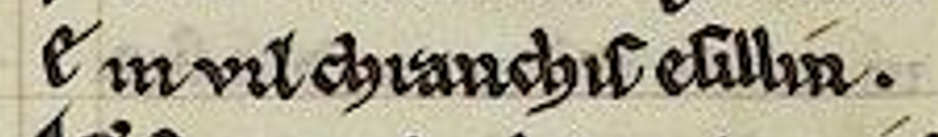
Ein vil chranchis eſillin.
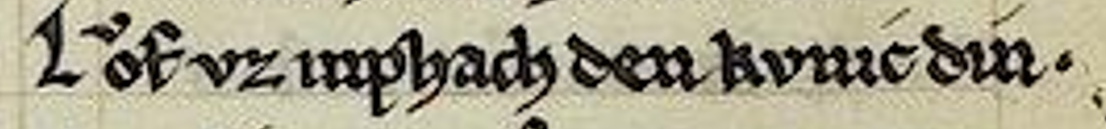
Lo°vf vz imphach den kvnic din.
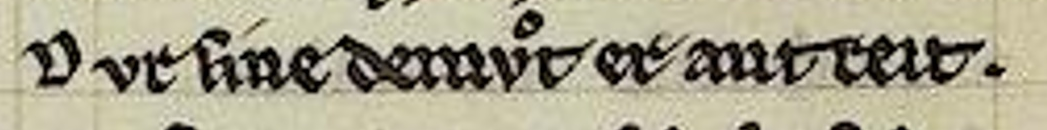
Dvr ſine demv°ot er antreit.
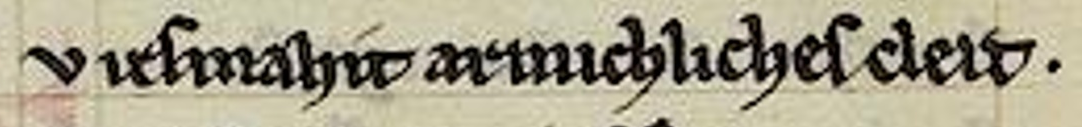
Virſmahit armichlicheſ cleit.
